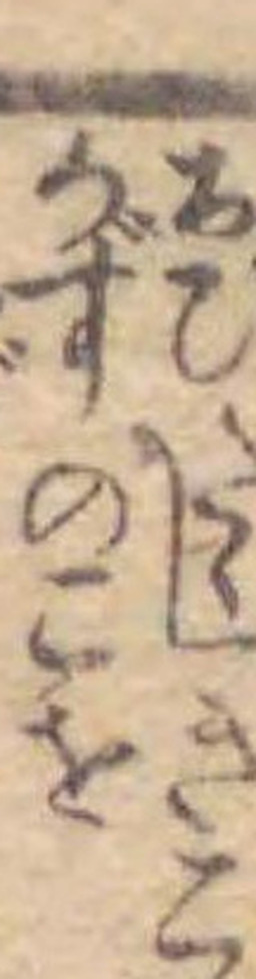かずのこを
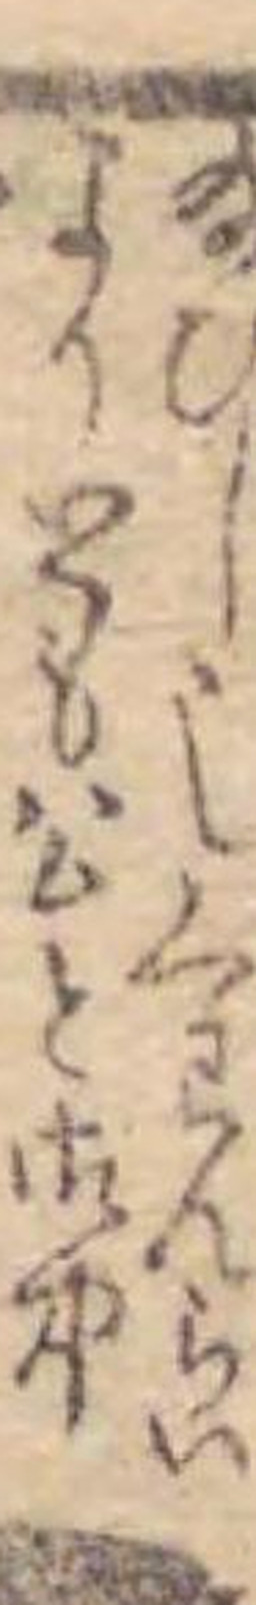よりとも公と御中
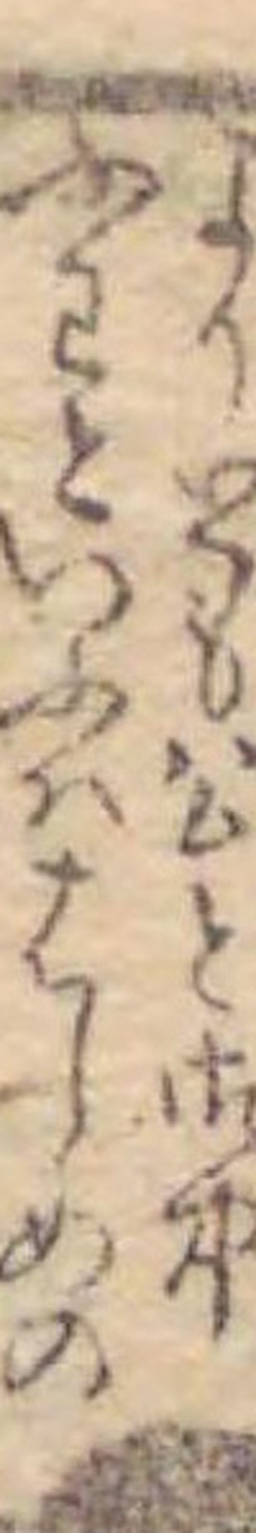ふわといふははしめの
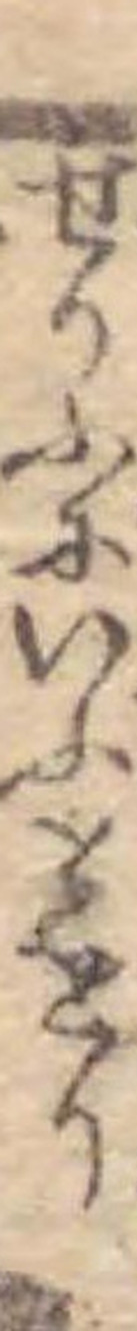せりふにいふとをり
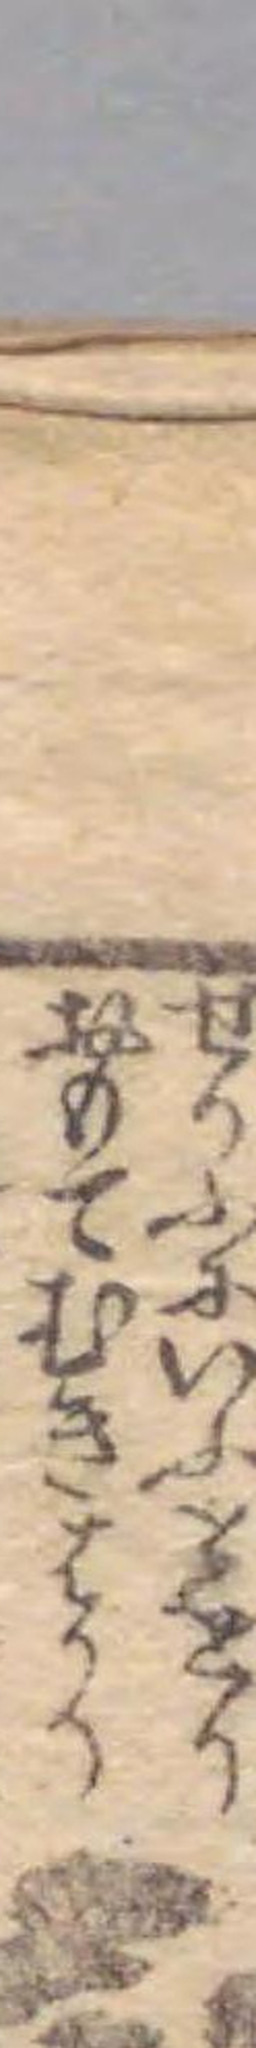おもてむきはかり
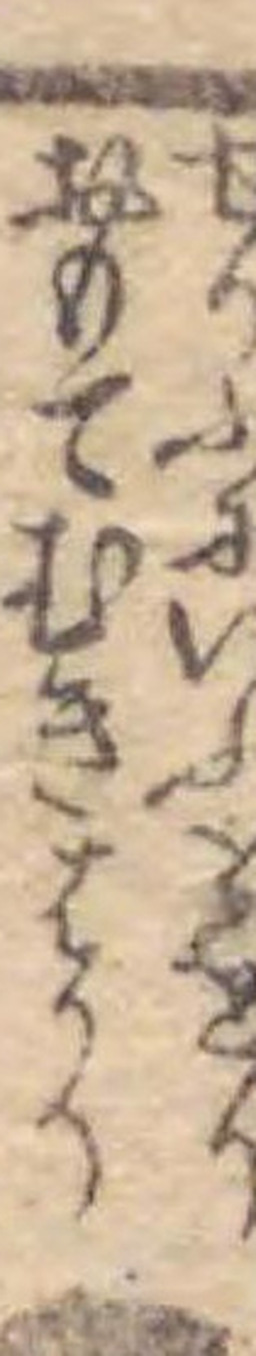おもてむきはかり
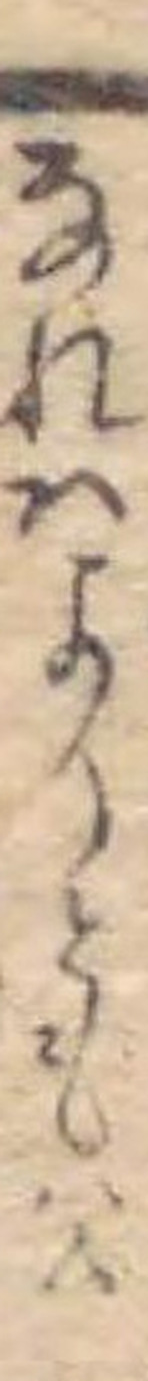なれはよりとも公
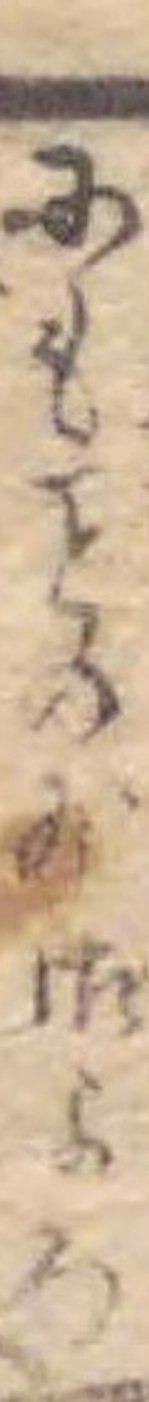にもことの外御よろ
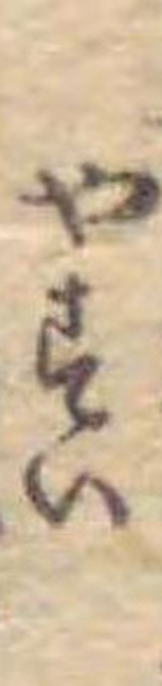やすい
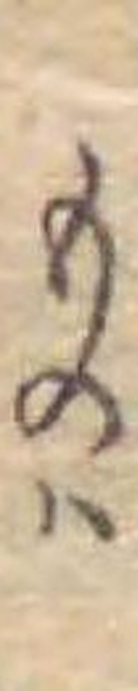ものは
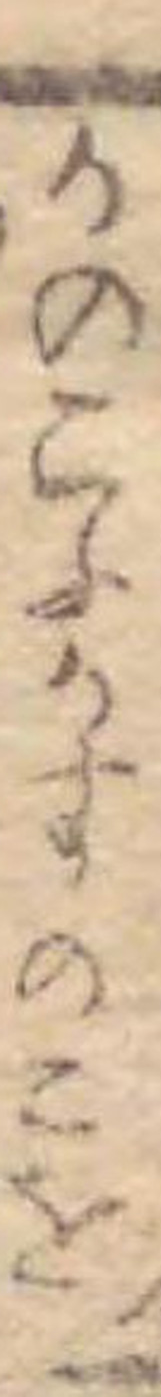かのこふかすのこを
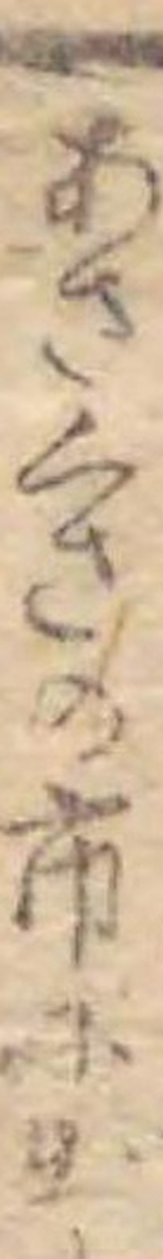あさくさの市に出し
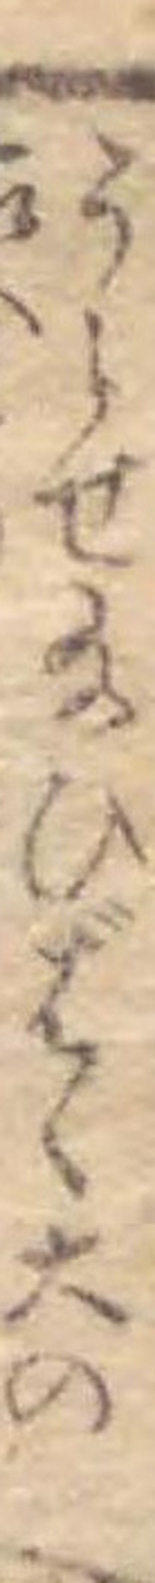うらせ給ひばく大の
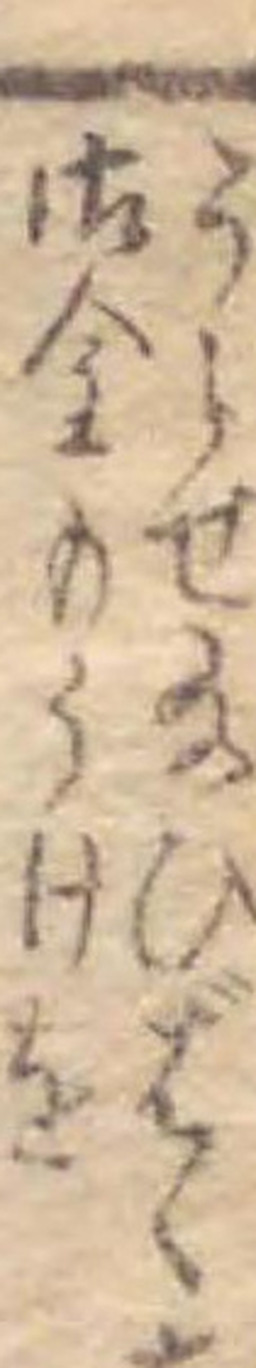御金もうけを
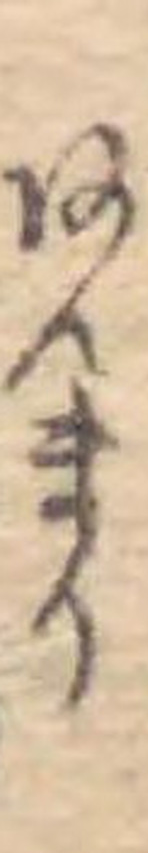あんまり
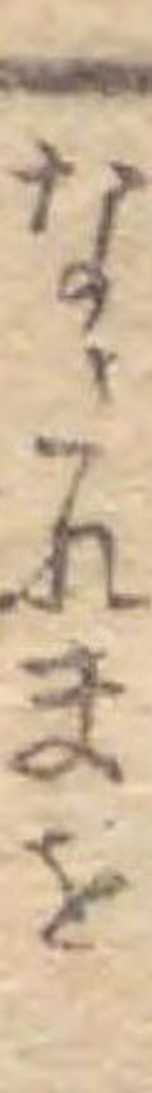なされ夫を
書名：悦贔負蝦夷押領 : 3巻
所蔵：国立国会図書館 National Diet Library, JAPAN
